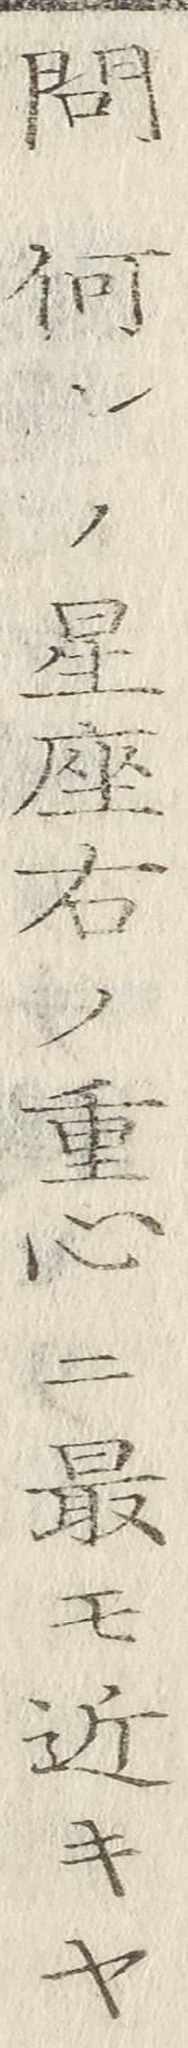問何レノ星座右ノ重心ニ最モ近キヤ
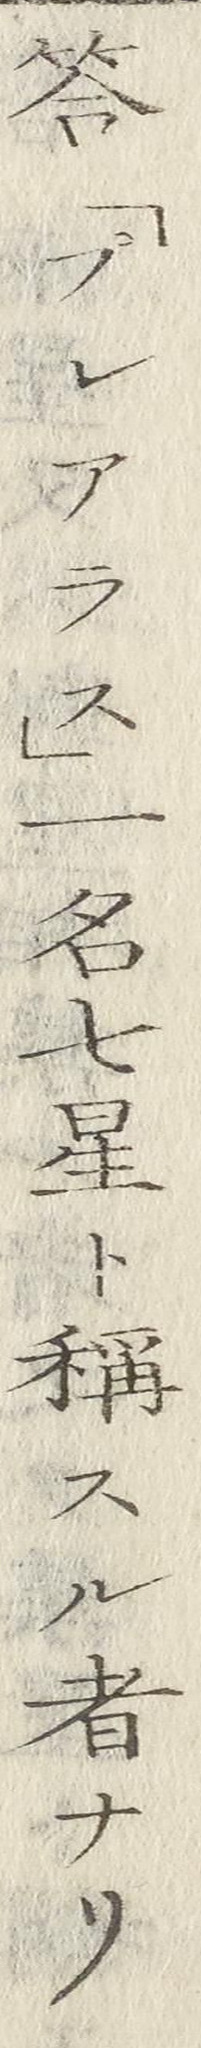答「プレアラス」一名七星ト称スル者ナリ
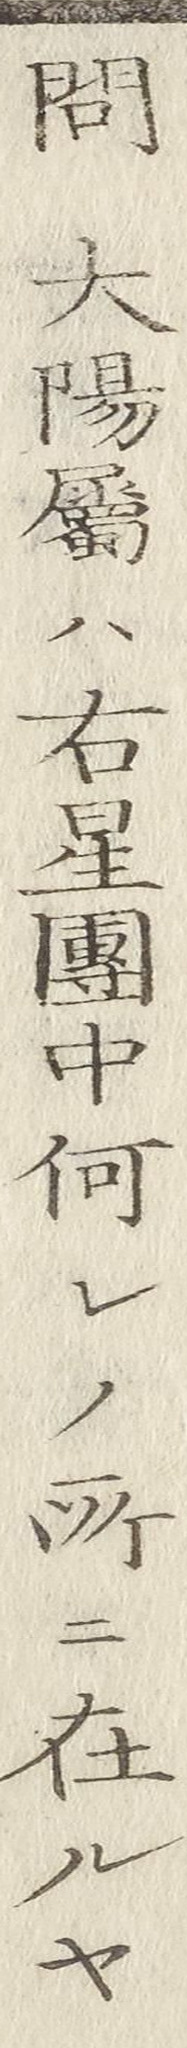問大陽属ハ右星団中何レノ所ニ在ルヤ
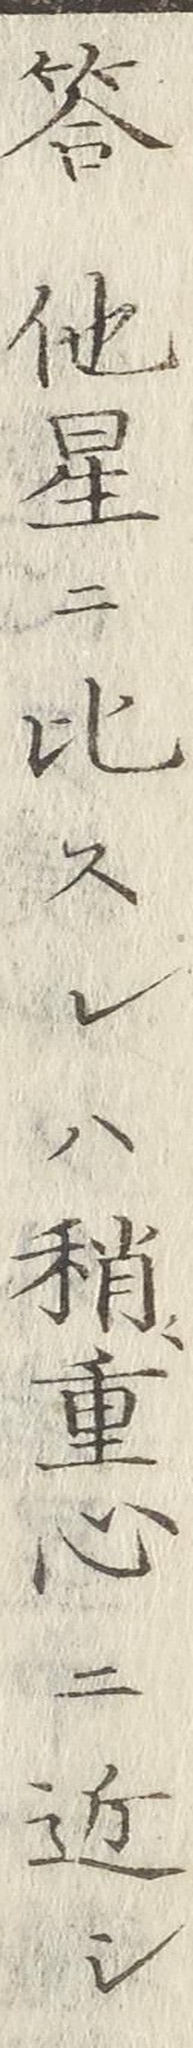答他星ニ比スレハ稍々重心ニ近シ
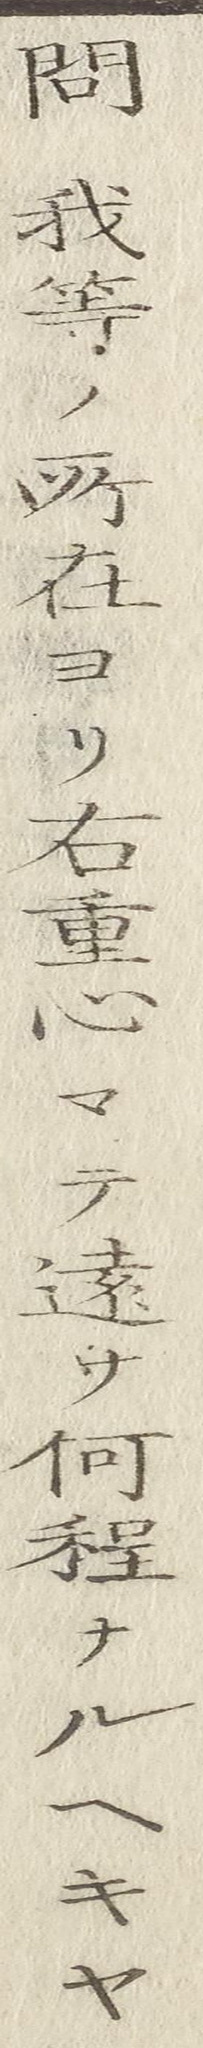問我等ノ所在ヨリ右重心マテ遠サ何程ナルヘキヤ
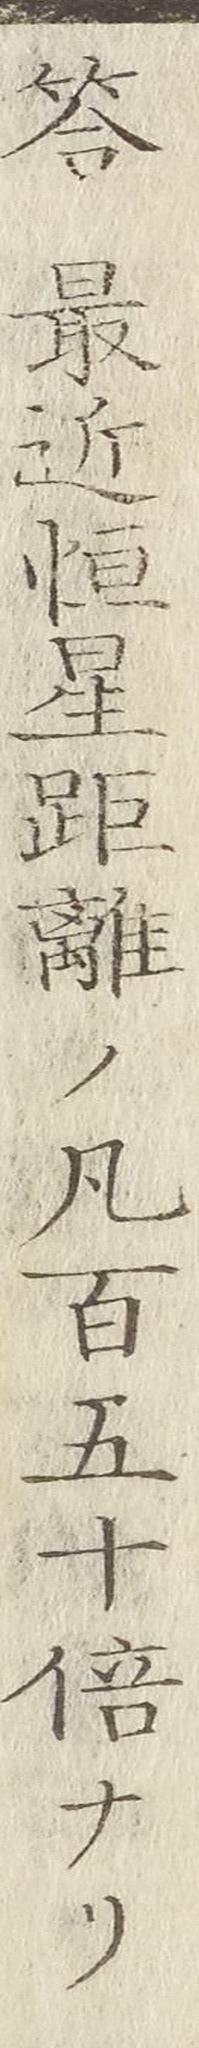答最近恒星距離ノ凡百五十倍ナリ

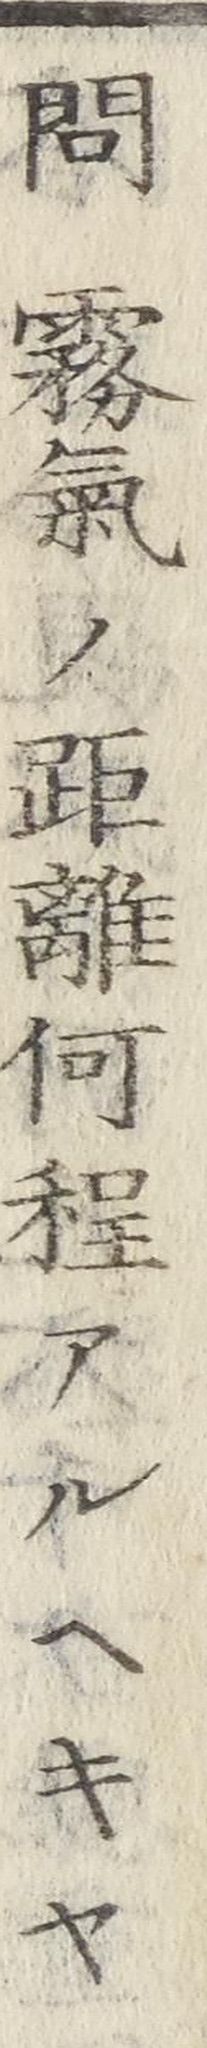問霧気ノ距離何ホドアルヘキヤ
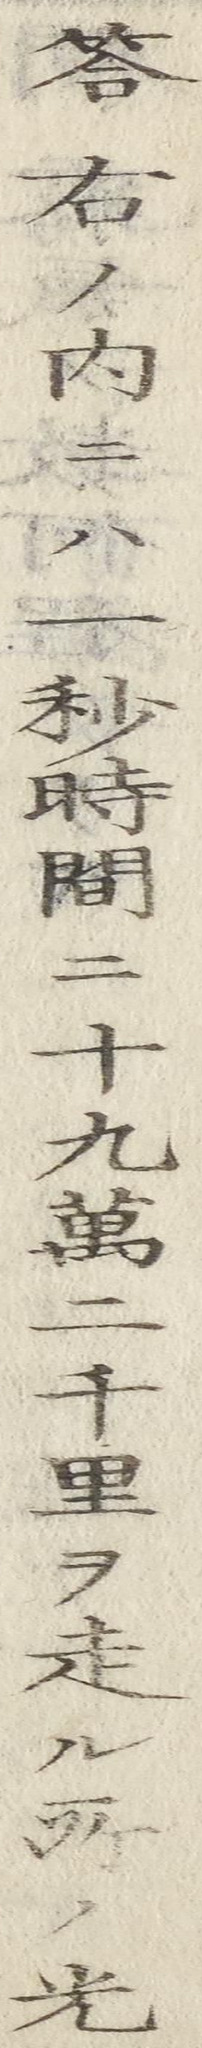答右ノ内ニハ一秒時間二十九万二千里ヲ走ル所ノ光
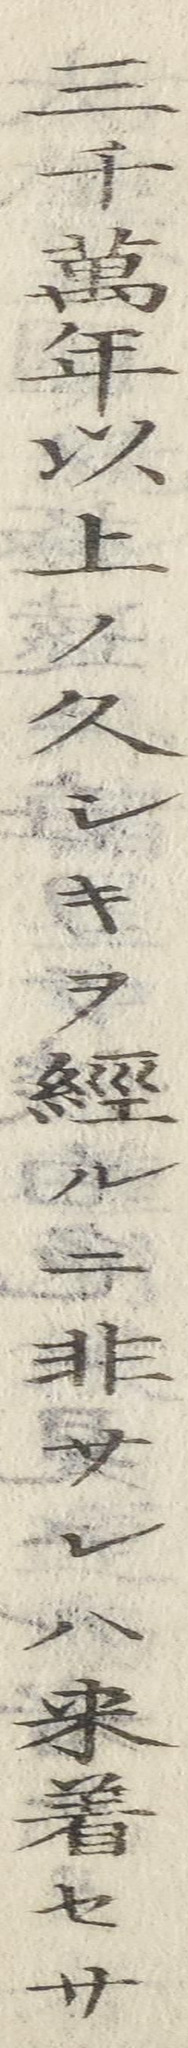三千万年以上ノ久シキヲ経ルニ非サレハ来着セサ
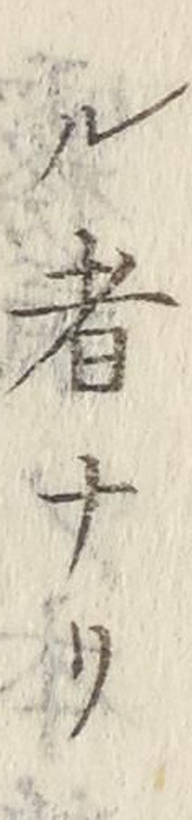ル者ナリ
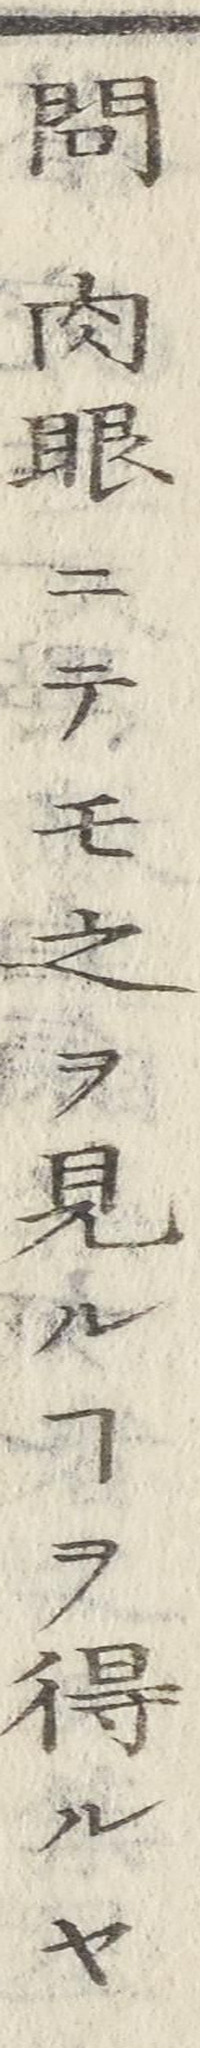問肉眼ニテモ之ヲ見ルコトヲ得ルヤ
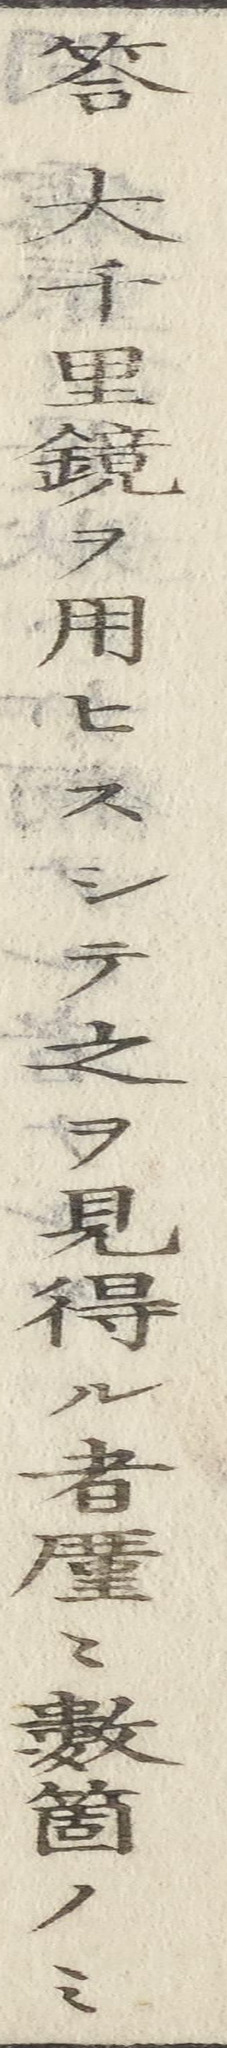答大千里鏡ヲ用ヒスシテ之ヲ見得ル者僅々数箇ノミ
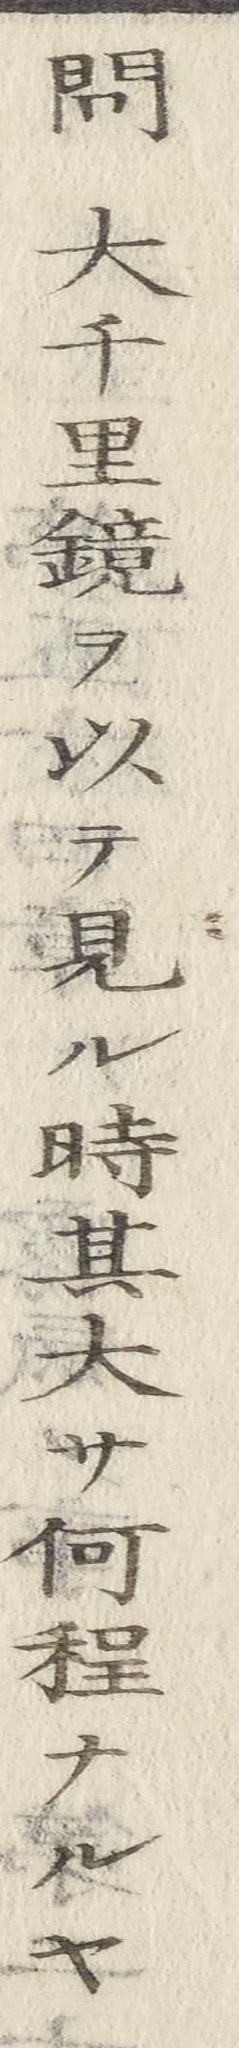問大千里鏡ヲ以テ見ル時其大サ何程ナルヤ
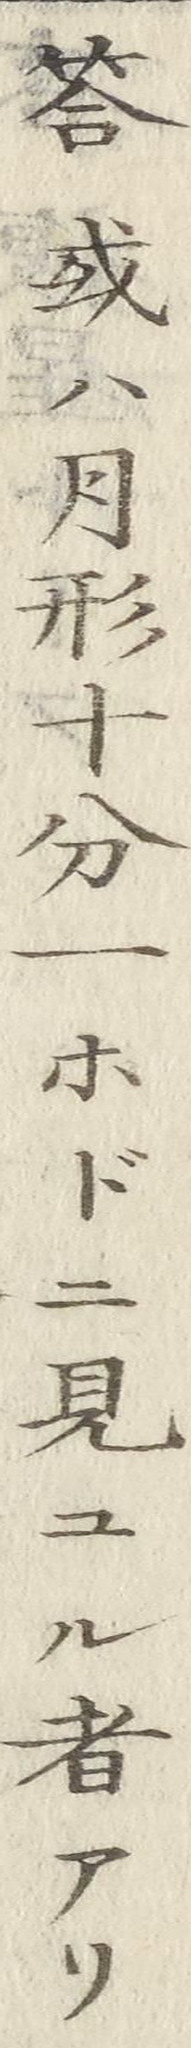答或ハ月形十分一ホドニ見ユル者アリ
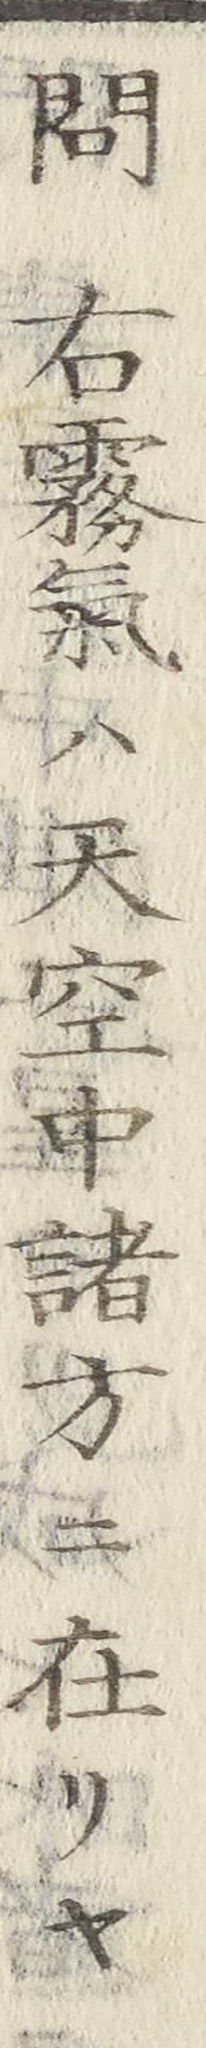問右霧気ハ天空中諸方ニ在リヤ
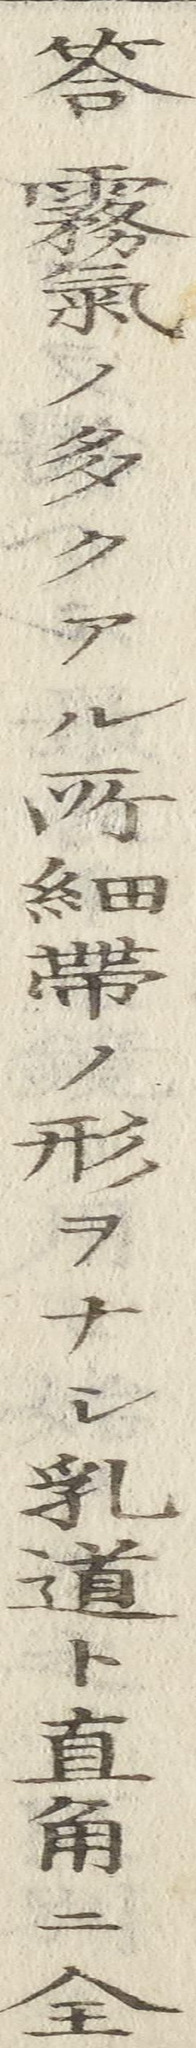答霧気ノ多クアル所細帯ノ形ヲナシ乳道ト直角ニ全
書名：星学圖説　下
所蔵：東京大学地震研究所図書室 Earthquake Research Institute Library, The University of Tokyo, JAPAN
